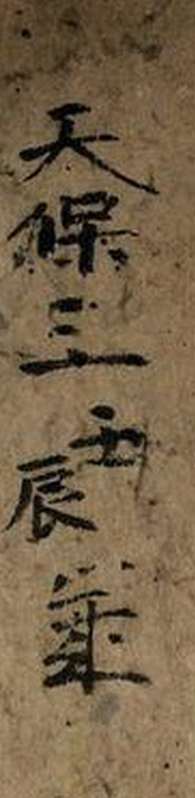天保三壬辰歳
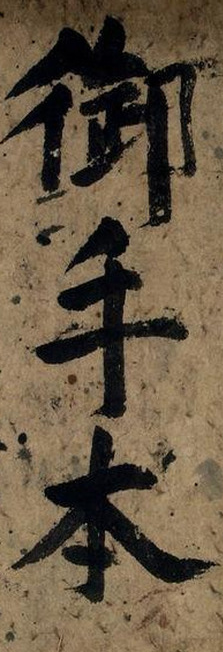御手本
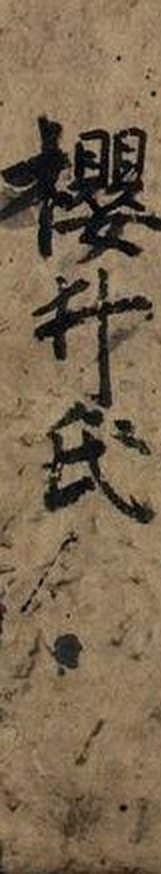桜井氏
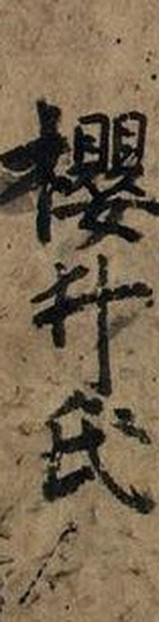桜井氏

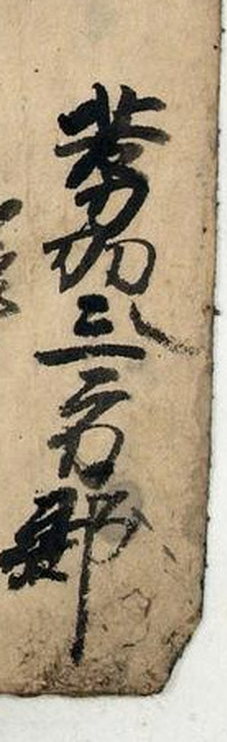若州三方郡
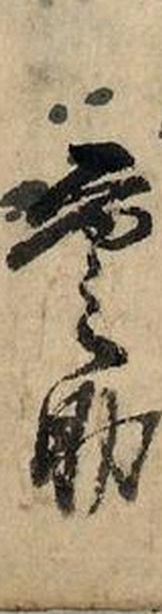市之助
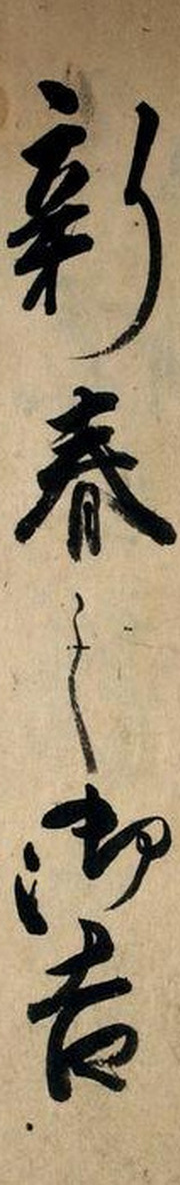新春之御吉
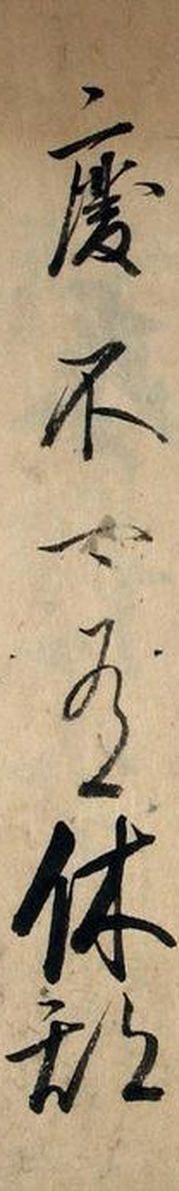慶不可有休期
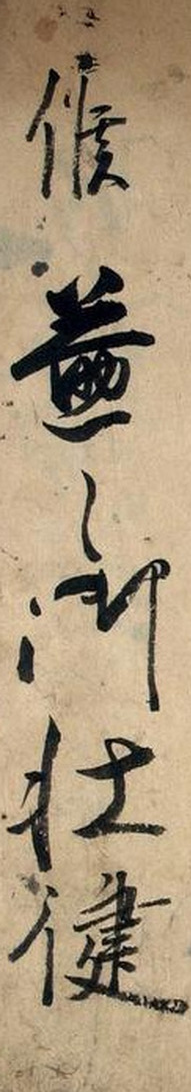候益々御壮健

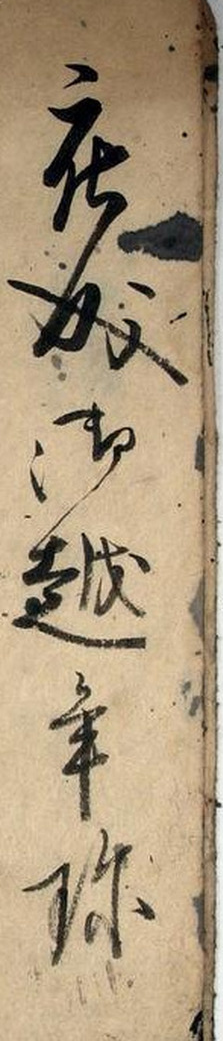被成御越年珍
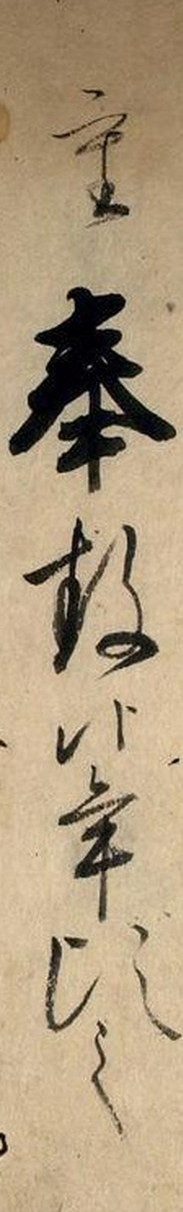重奉存候年頭之
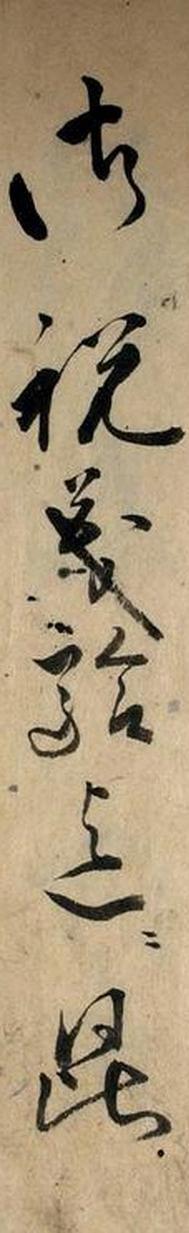御祝義験迄ニ昆
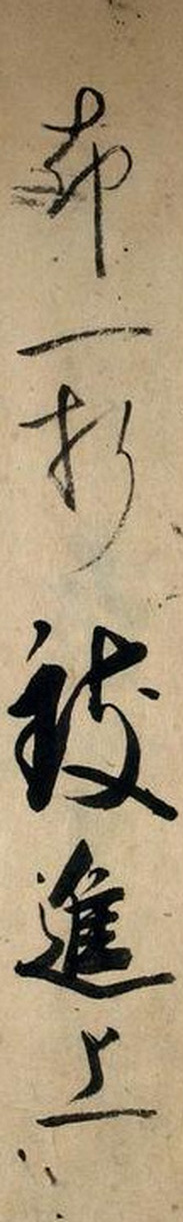布一折致進上
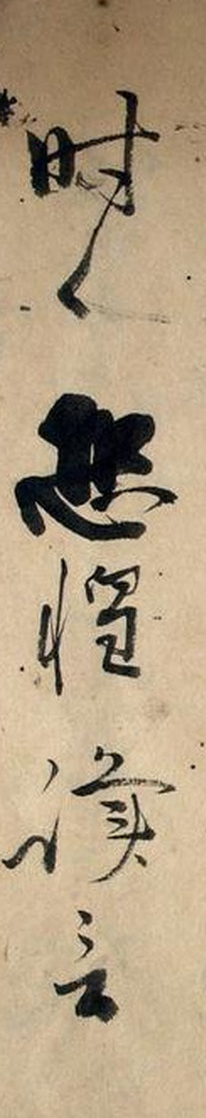時候恐惶謹言

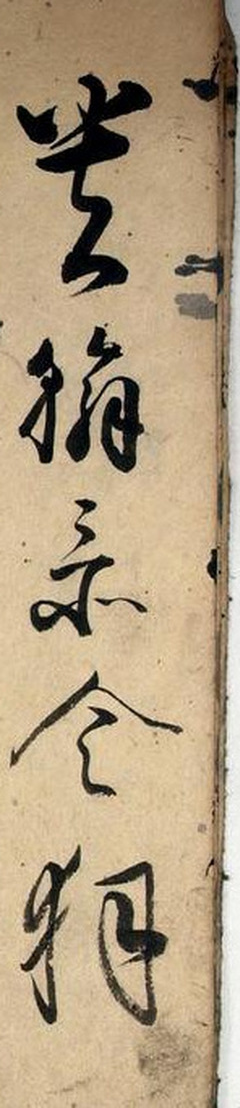貴翰忝令拝
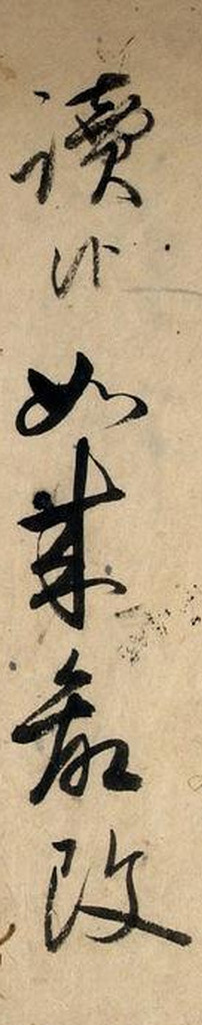読候如来命改
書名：御手本（手習、消息文、和漢朗詠集・論語の一節）
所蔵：福井県文書館 Fukui Prefectural Archives
